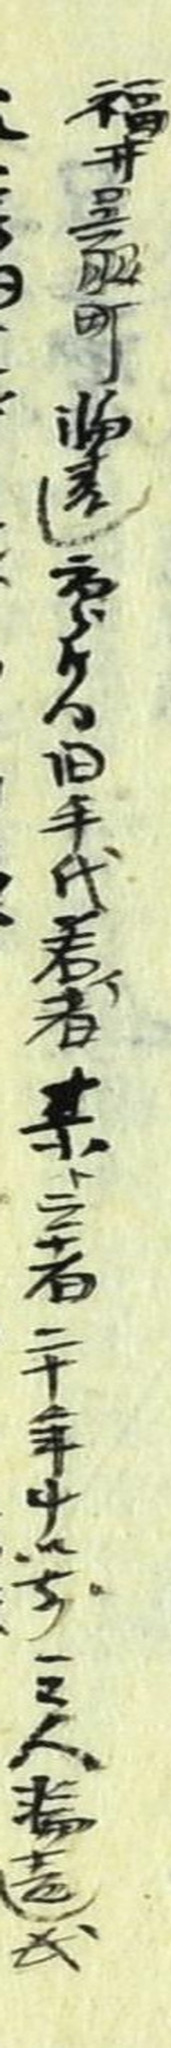福井呉服町輪違市郎左衛門旧手代若イ者某ト云者二十年計以前主人輪違氏
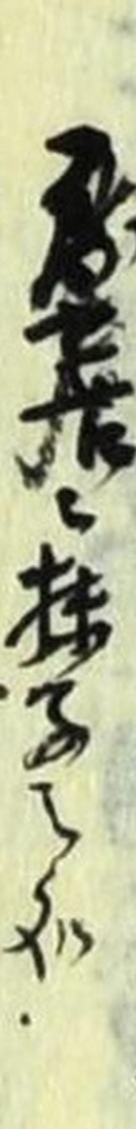致居候様子之処
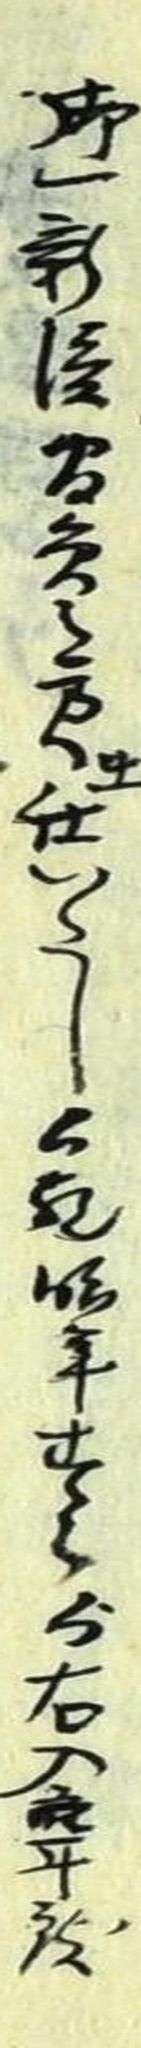御一新後官員之方へ出仕いたし候歟昨年春ゟ右入牢致
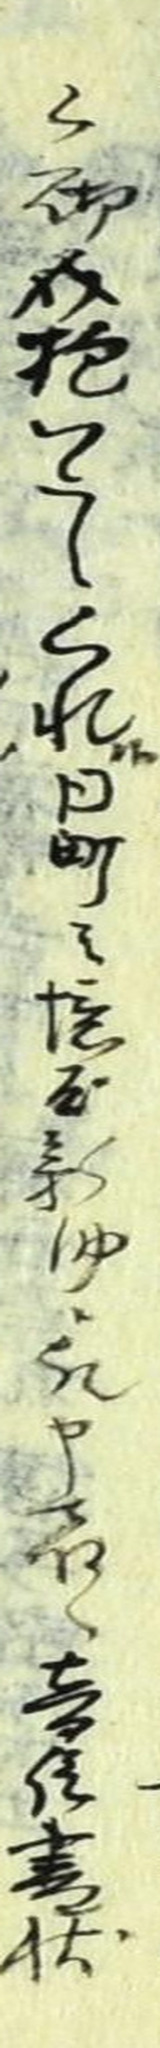候砌介抱いたしくれ候同町之境屋新助ト歟申者へ音信書状
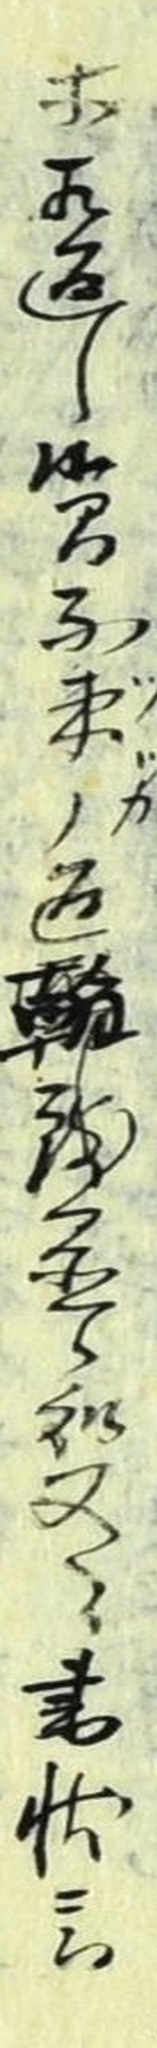等相通し候間不束ノ返翰致置候処又々書状ニ而
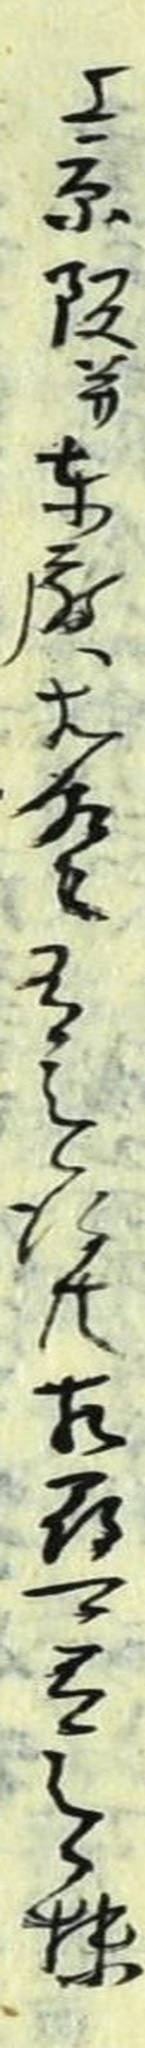上京阪幷東府へ相登有之候得共相尋可有之候様
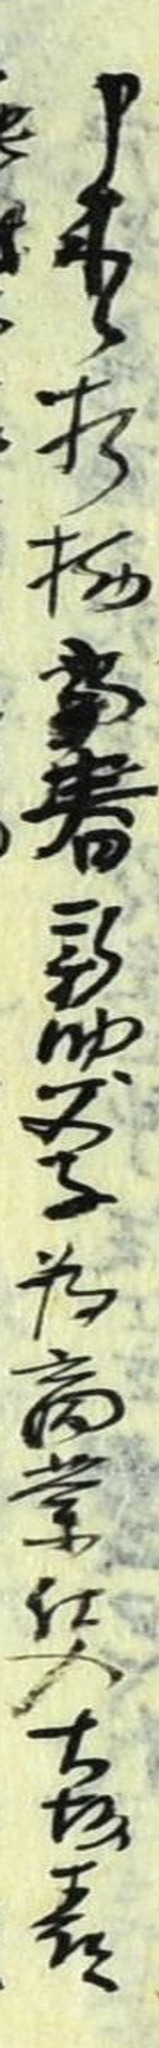申来候折柄当春新助父子為商業仕入大坂表へ
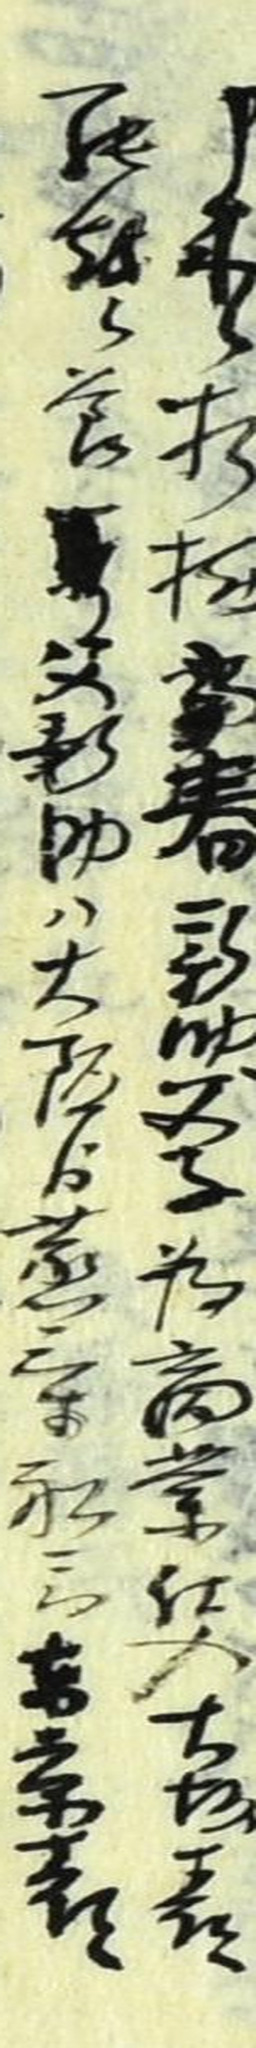罷越候節父新助ハ大阪ゟ蒸気船ニ而東京表へ
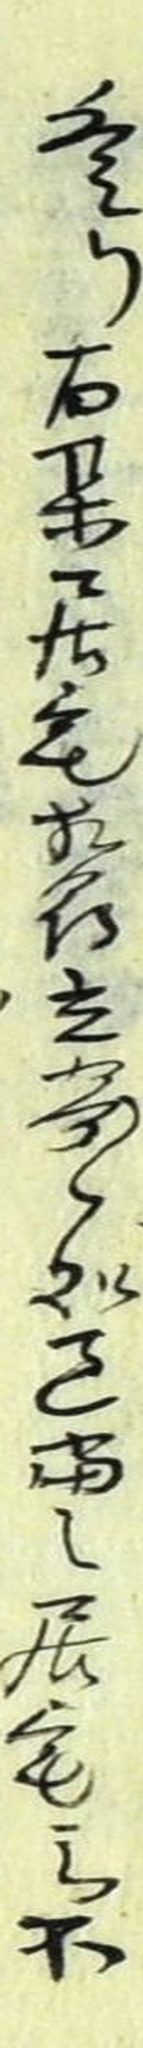参リ右某居宅相尋立寄候処過当之居宅ニ而不
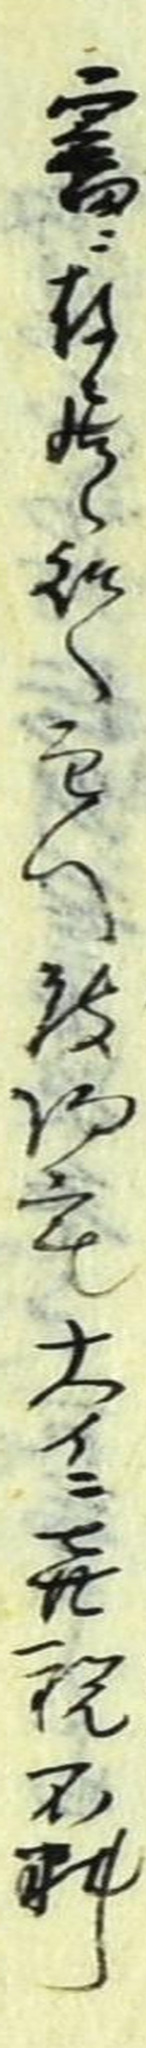審ニ存居候処へ主人致帰宅大イニ喜祝不料
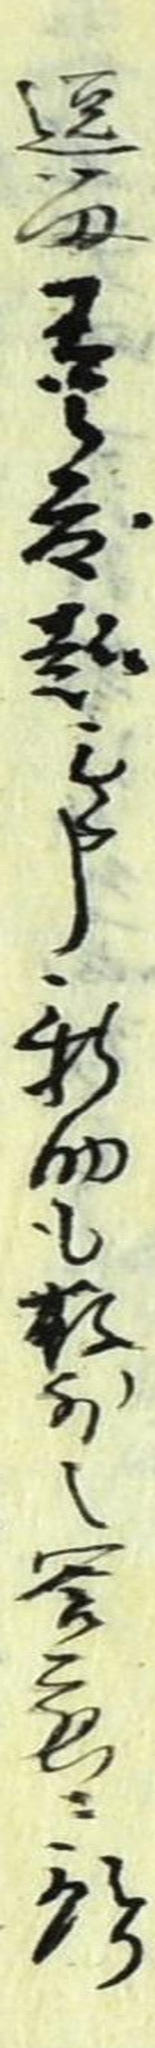逗留有之度趣被申新助も存外之饗応ニ預リ
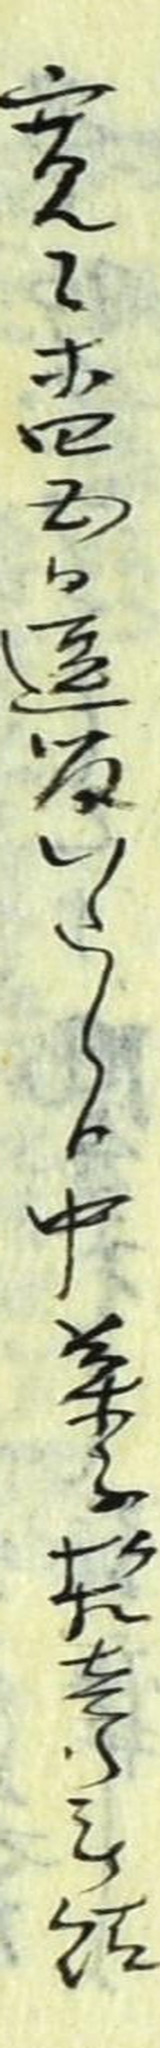寛々等四五日逗留いたし候中菓子箱壱ツ計請
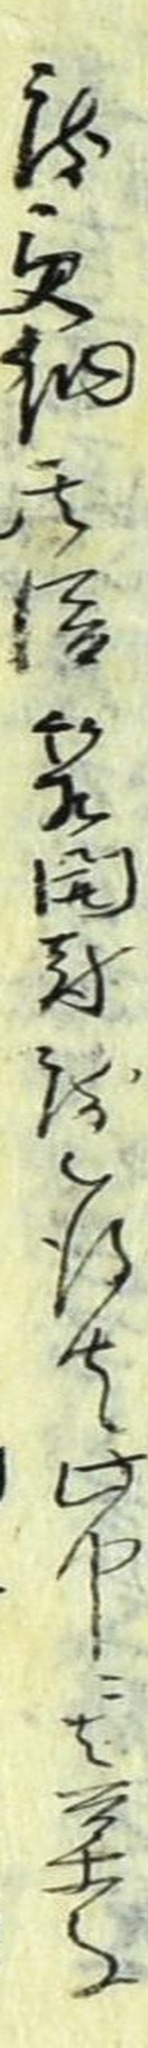致受納其後箱開封致候得者此中ニ者菓子

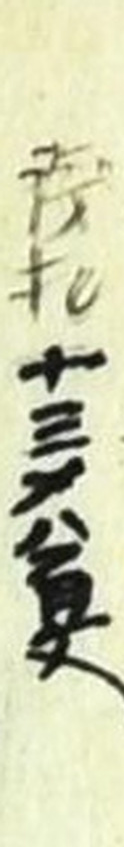銭札十三貫八百文
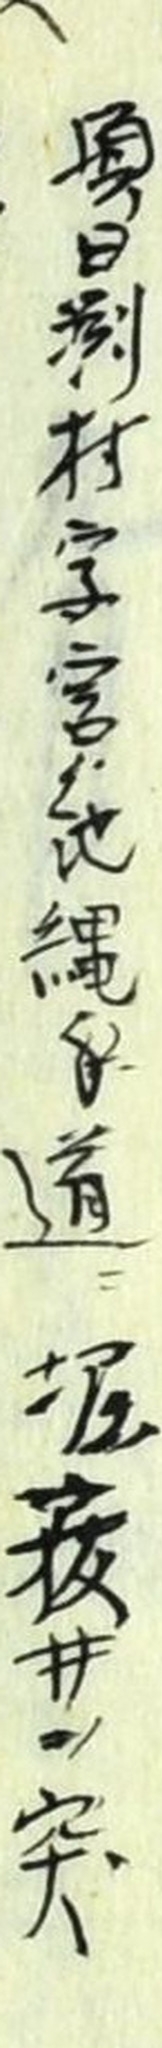頃日淵村字宮ノ池縄手道ニ堀抜井ノ突
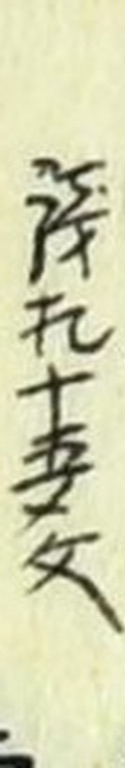銭札十五文」
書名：（日記）
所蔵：福井県文書館 Fukui Prefectural Archives
